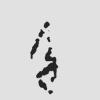畜
